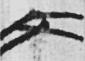文
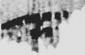王
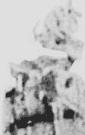王
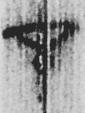才（在）
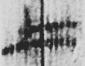上
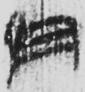於
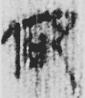卲（昭）
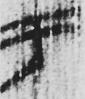于
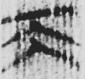天
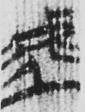○（吾）
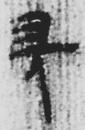𡵂（美）
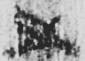之
